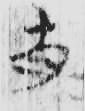十月
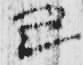己
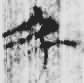丑
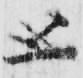之
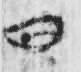日
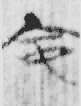○（中）
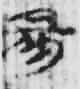昜（陽）
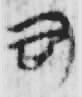司
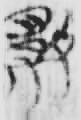敗
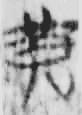黃
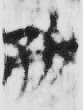○（勇）
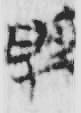受
